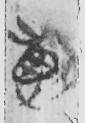{叀刀}
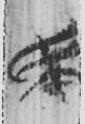民
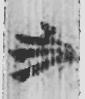之
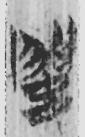{門串}（關）
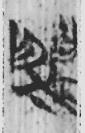閟
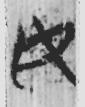女
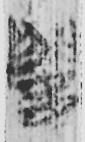{門串}（關）
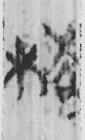柭
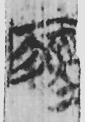{戶巠}
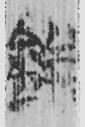{金𠔉}
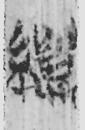{糸興}
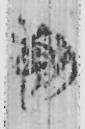{叀刀}
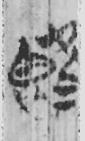既
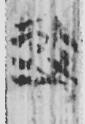政
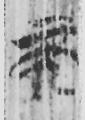而
